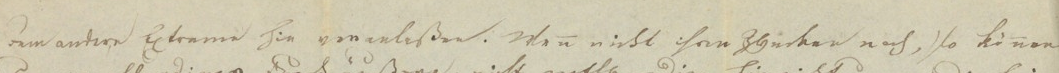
dem andern Extreme hin veranlaßen. Wenn nicht ihren Zwecken nach, so können
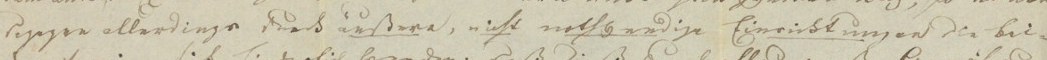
dagegen allerdings durch äußere, nichtnothwendigeEinrichtungen die bei-
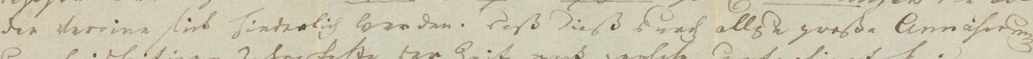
den Vereine sich hinderlich werden. Daß dieß durch allzu große Annäherung
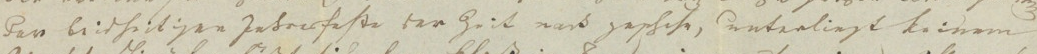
der beidseitigen Jahresfeste der Zeit nach geschehe, unterliegt keinem
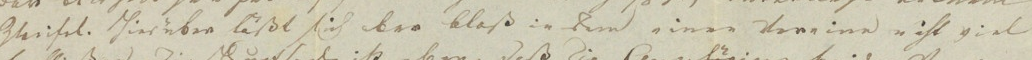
Zweifel. Hierüber läßt sich aber bloß in dem einen Vereine nicht viel
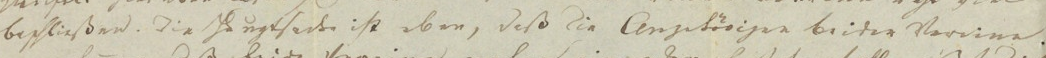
beschließen. Die Hauptsache ist eben, daß die Angehörigen beider Vereine
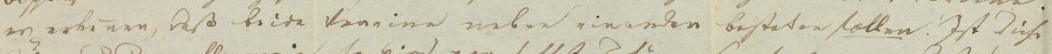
es erkennen, daß beide Vereine neben einander bestehen sollen. Ist diese
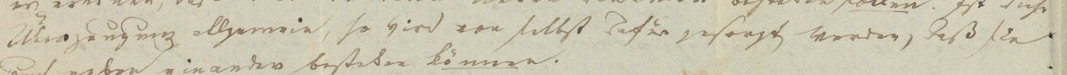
Überzeugung allgemein, so wird von selbst dafür gesorgt werden, daß sie
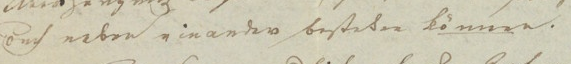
auch neben einander bestehen können.
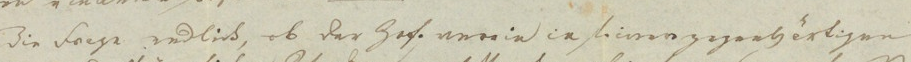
Die Frage endlich, ob der Zof.verein in seiner gegenwärtigen
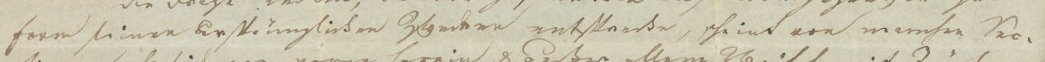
Form seinen ursprünglichen Zwecken entspreche, scheint von manchen Sec-
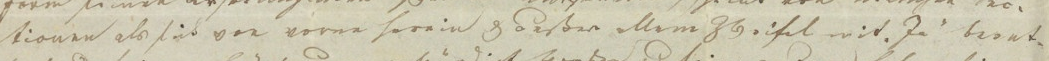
tionen als sich von vorne herein & außer allem Zweifel mit «Ja» beant-
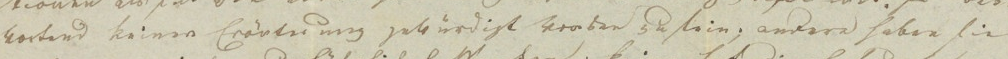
wortend keiner Erörterung gewürdigt worden zu sein; andere haben sie
